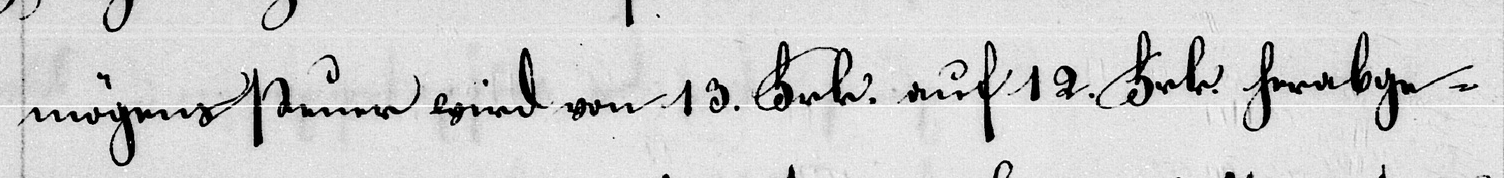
mögenssteuer wird von 13. Frk. auf 12. Frk. herabge¬
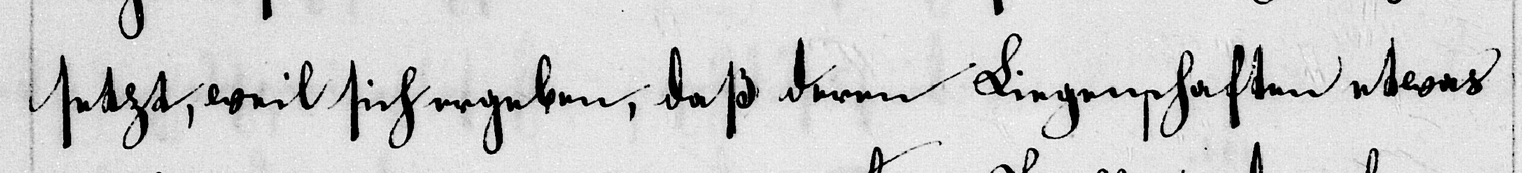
setzt, weil sich ergeben, daß deren Liegenschaften etwas
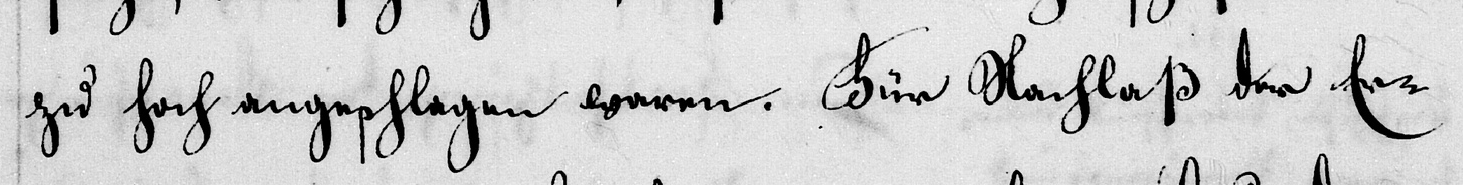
zu hoch angeschlagen waren. Für Nachlaß der Er¬
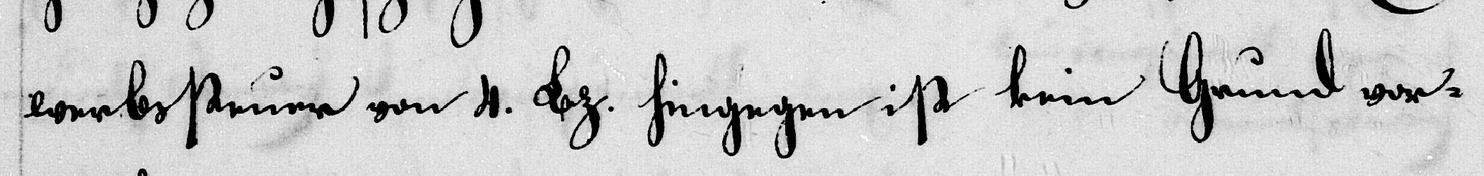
werbssteuer von 4. Bz. hingegen ist kein Grund vor¬
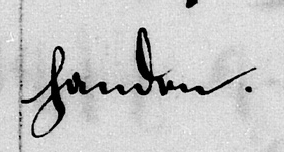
handen.
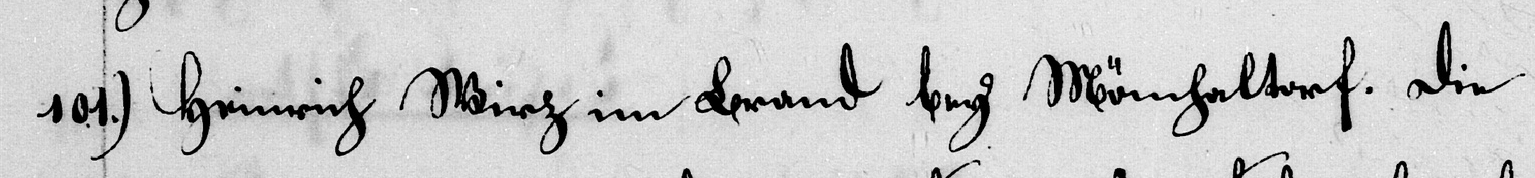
101.) Heinrich Wirz im Brand bey Mönchaltorf. Die
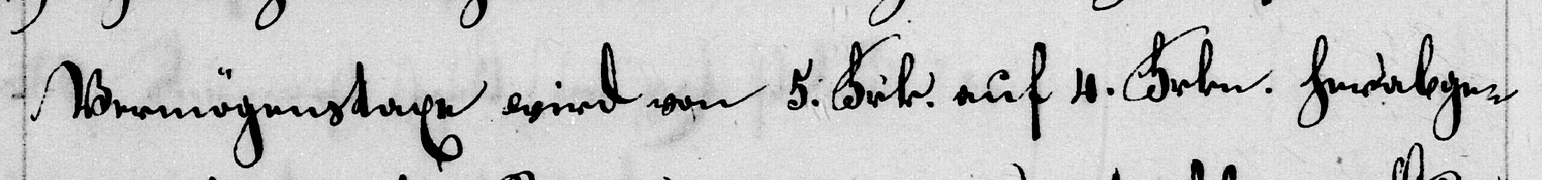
Vermögenstaxe wird von 5. Frk. auf 4. Frkn. herabge¬
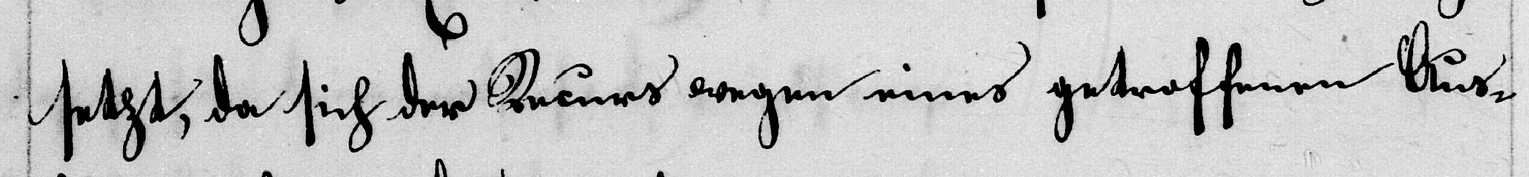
setzt, da sich der Recurs wegen eines getroffenen Aus¬
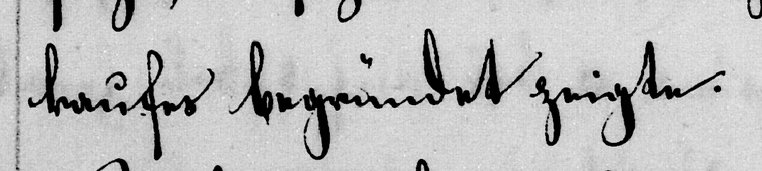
kaufes begründet zeigte.
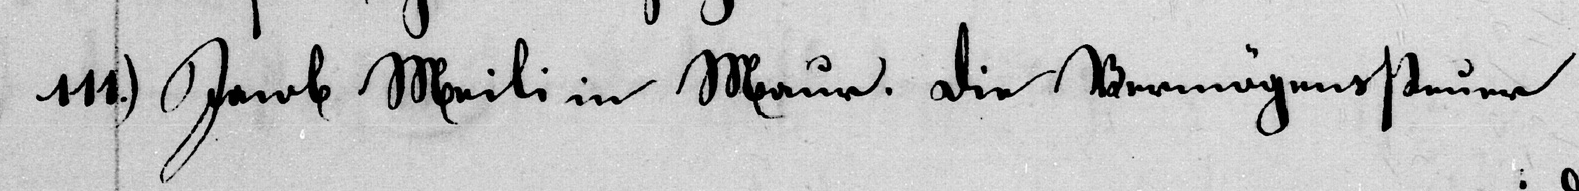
111.) Jacob Meili in Maur. Die Vermögenssteuer
